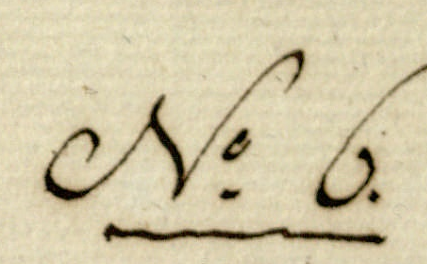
No 6.
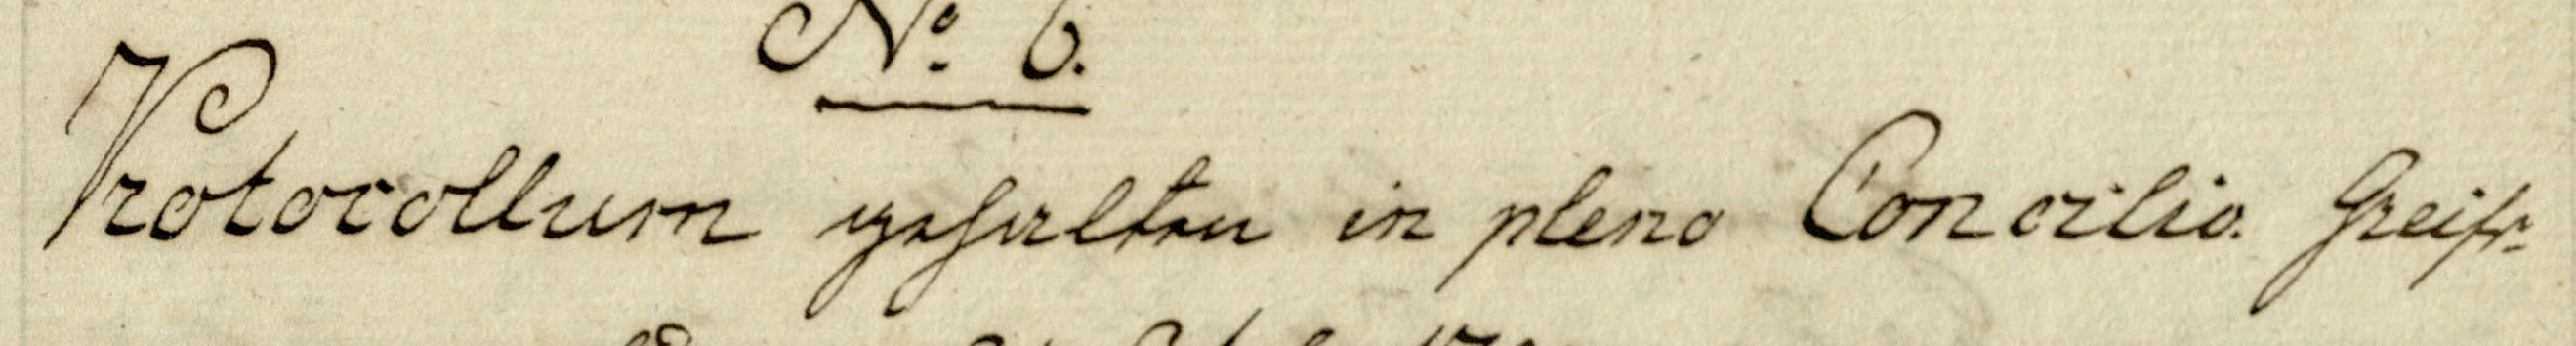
Protocollum gehalten in pleno Concilio Greifs¬
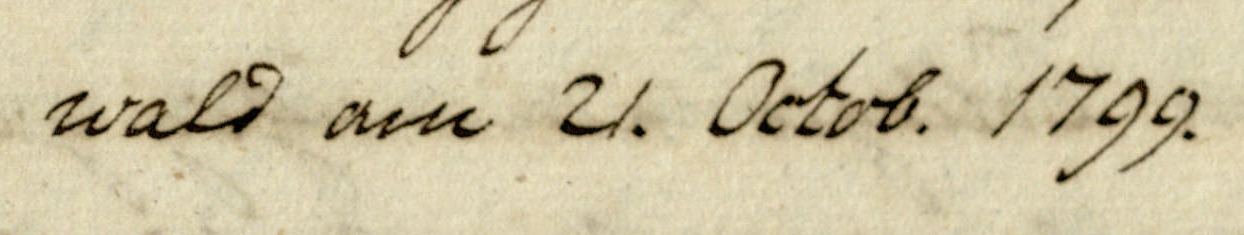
wald am 21. Octob. 1799.
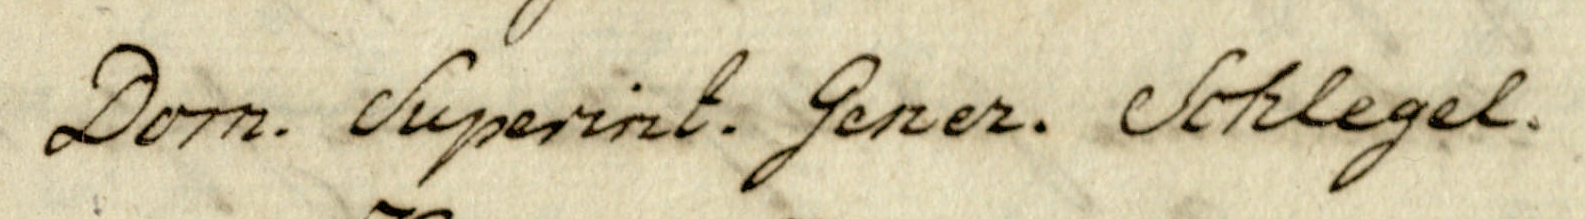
Dom. Superint. Gener. Schlegel.
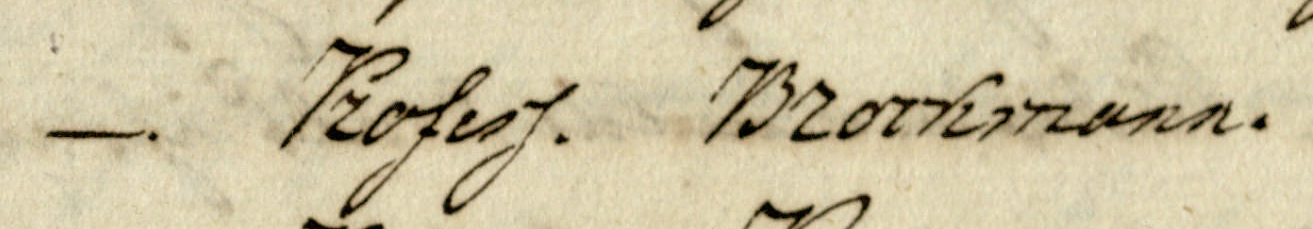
Profess. Brockmann.
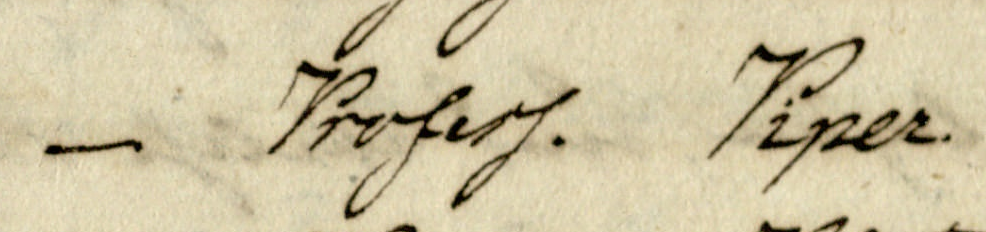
Profess. Piper.
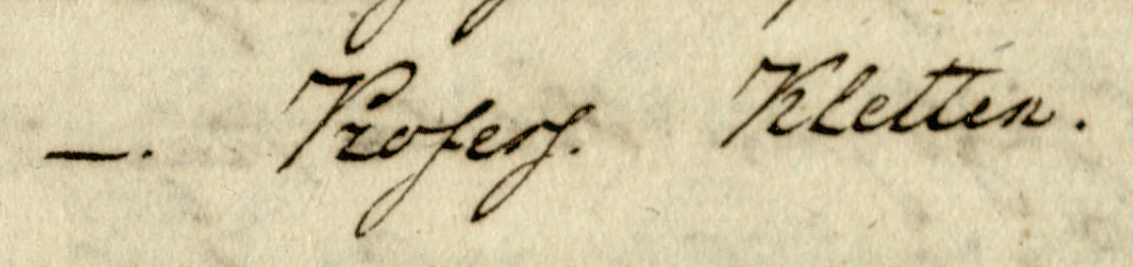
Profess. Kletten.
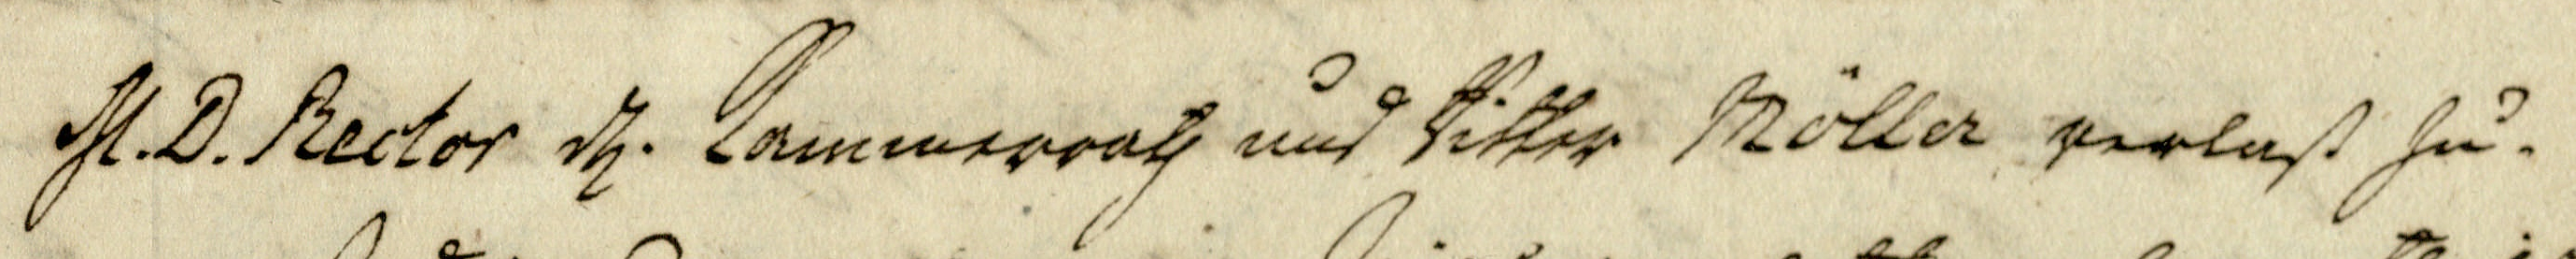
M. D. Rector dh. Kammerrath und Ritter Möller verlaß zu¬
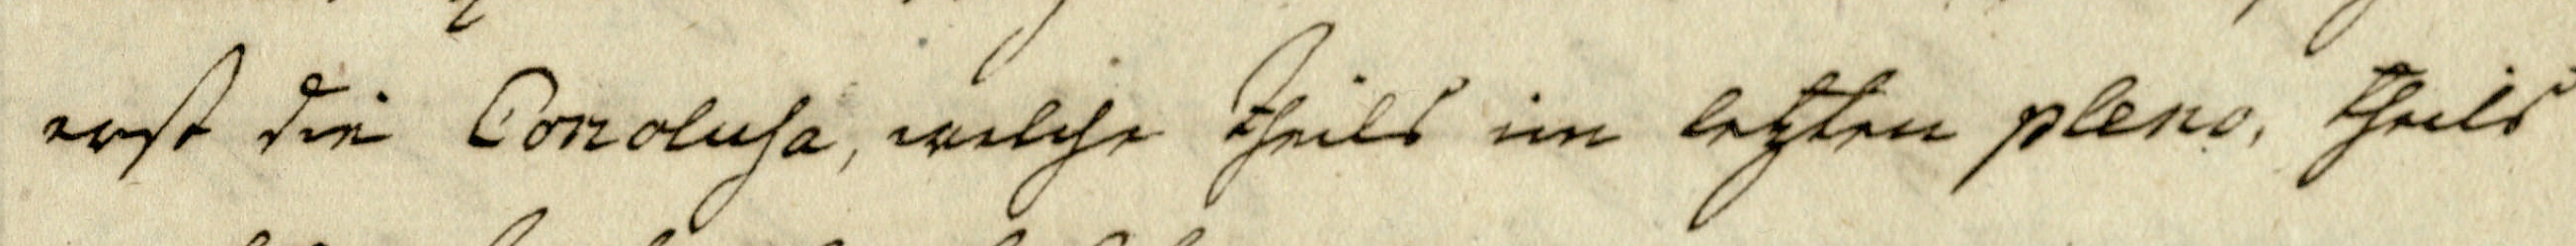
erst die Conclusa, welche Theils im letzten pleno, theils
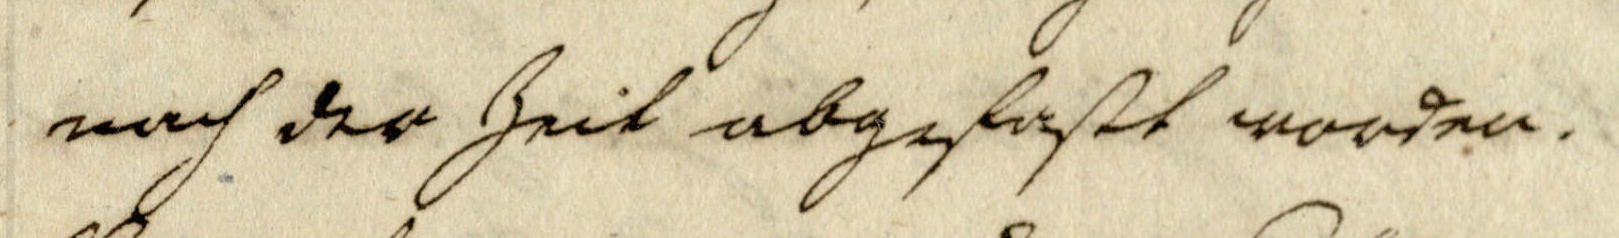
nach der Zeit abgefaßt worden.
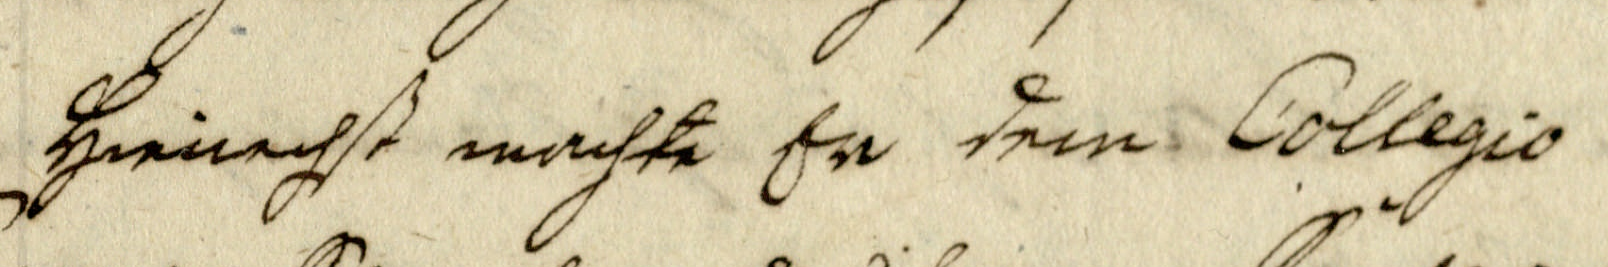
Hienechst machte Er dem Collegio
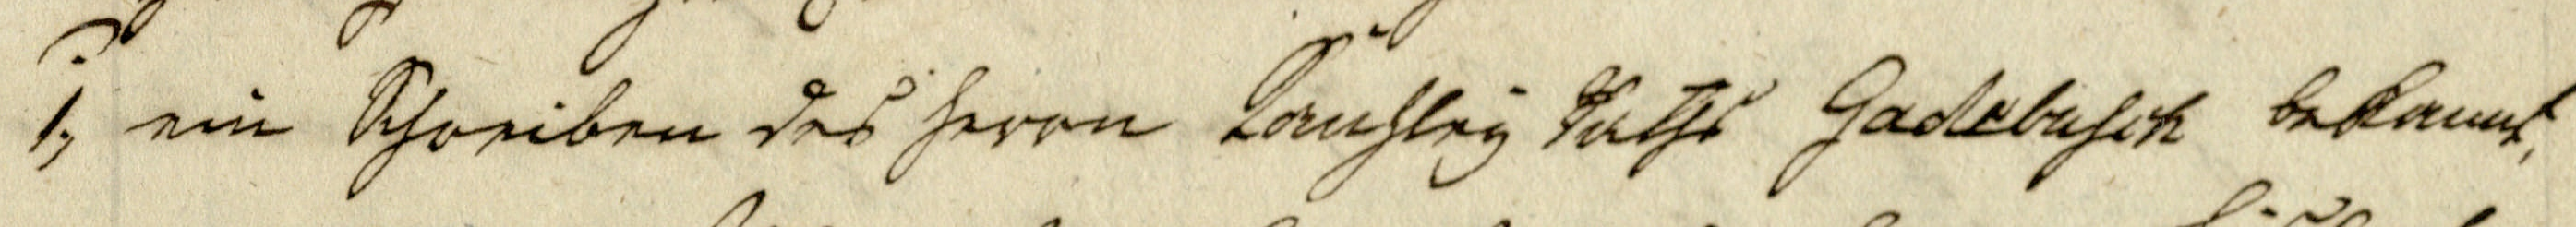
1, ein Schreiben des Herrn Kanzleÿ Raths Gadebusch bekannt,
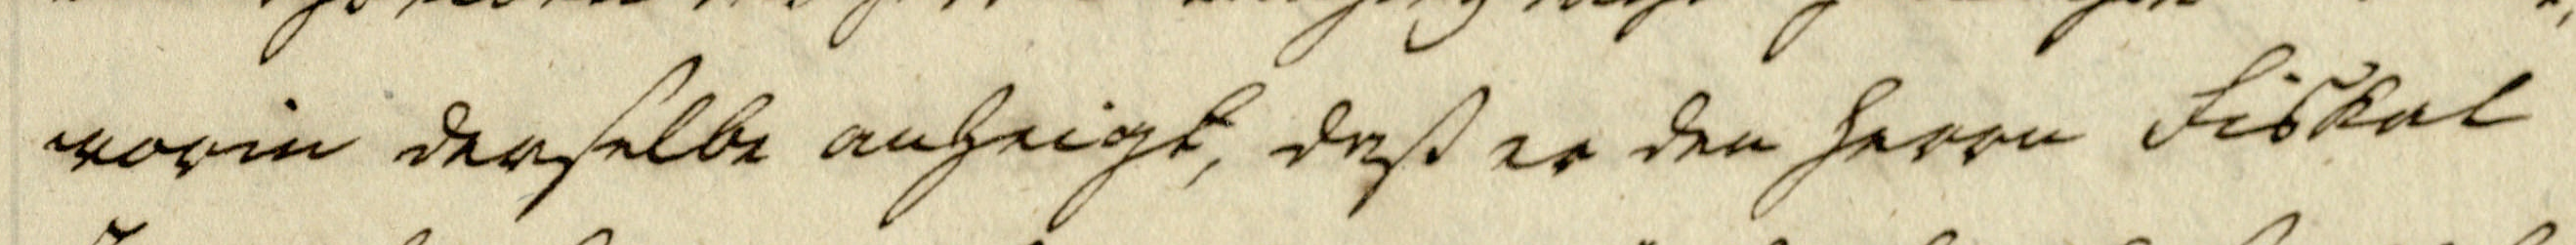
worin derselbe anzeigt, daß er den Herrn Fiskal
